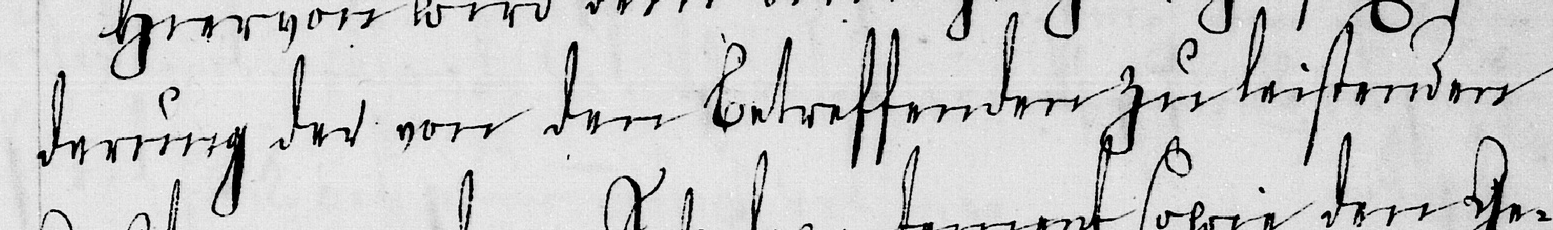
derung der von den betreffenden zu leistenden
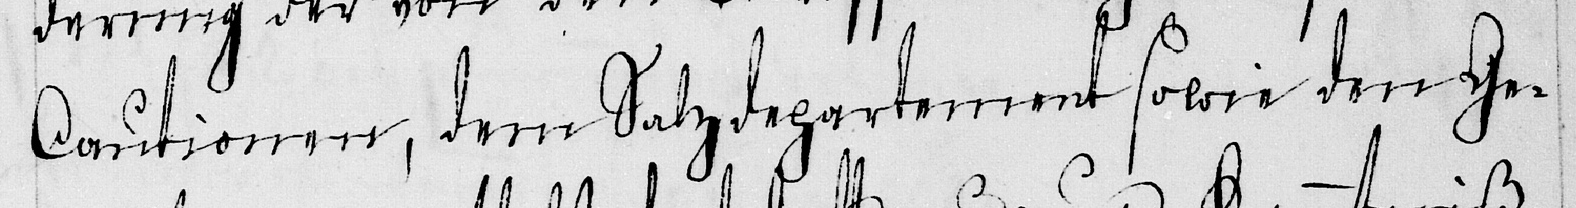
Cautionen, dem Salzdepartement sowie den Ge¬
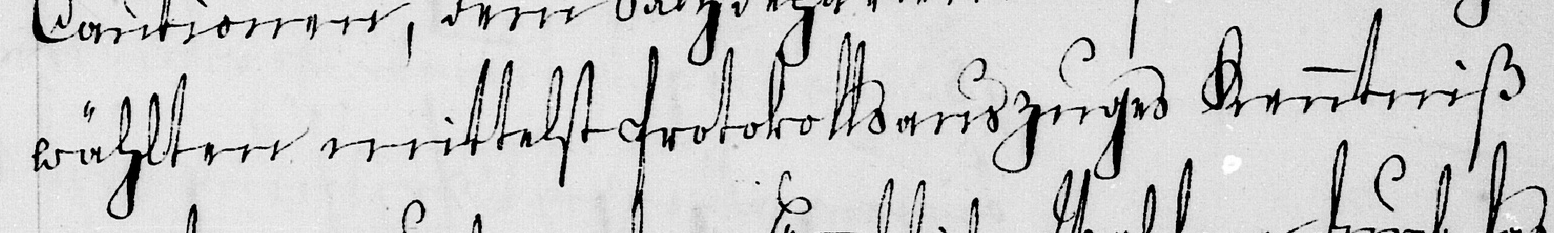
wählten mittelst Protokollsauszuges Kenntniß
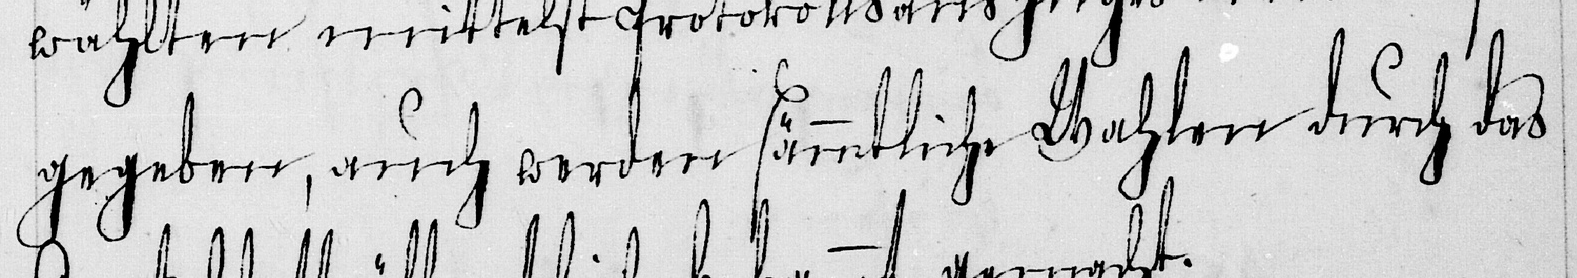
gegeben, auch werden sämmtliche Wahlen durch das
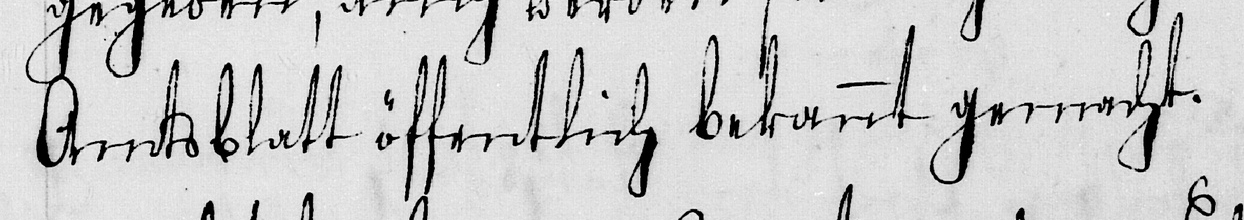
Amtsblatt öffentlich bekannt gemacht.
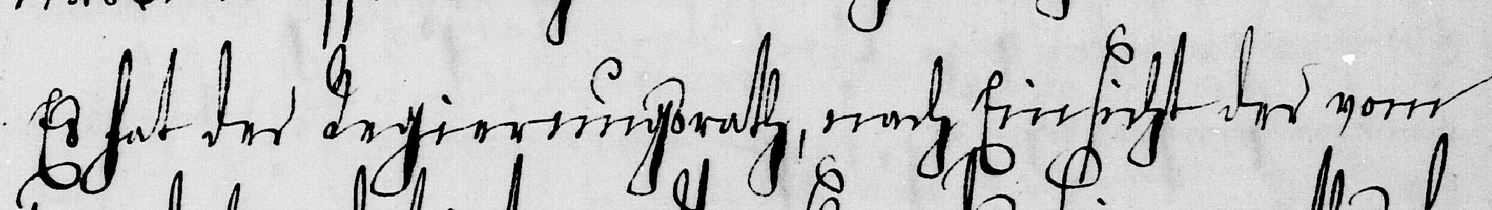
Es hat der Regierungsrath, nach Einsicht der vom
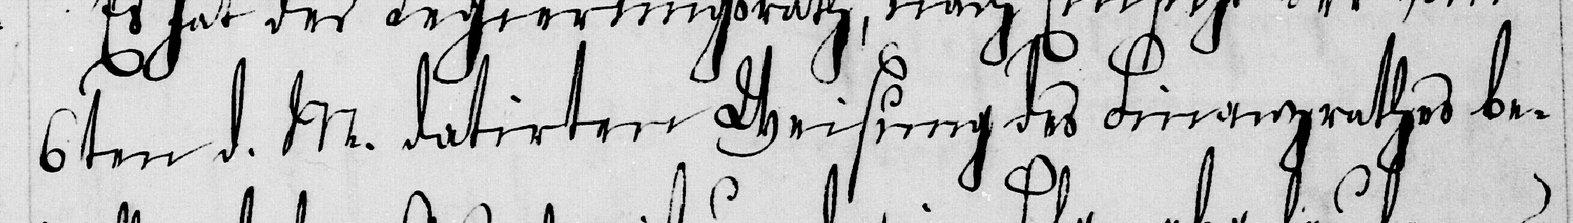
6ten d. M. datirten Weisung des Finanzrathes be¬
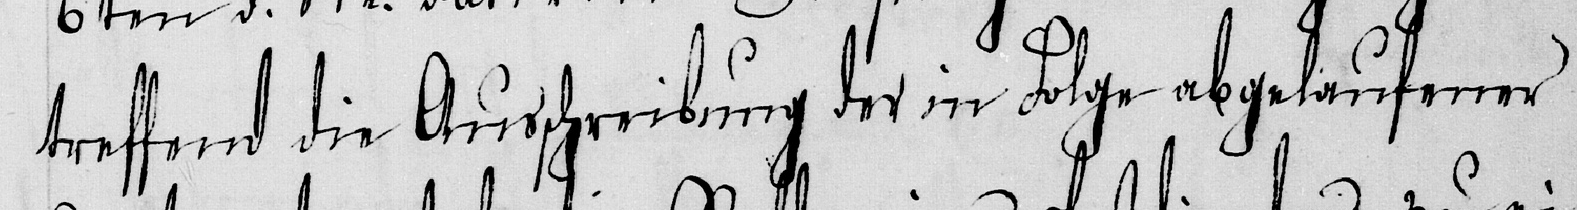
treffend die Ausschreibung der in Folge abgelaufener
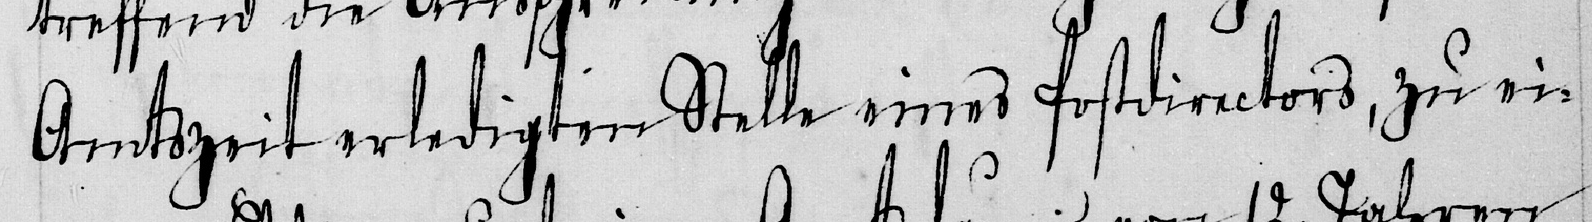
Amtszeit erledigten Stelle eines Postdirectors, zu ei¬
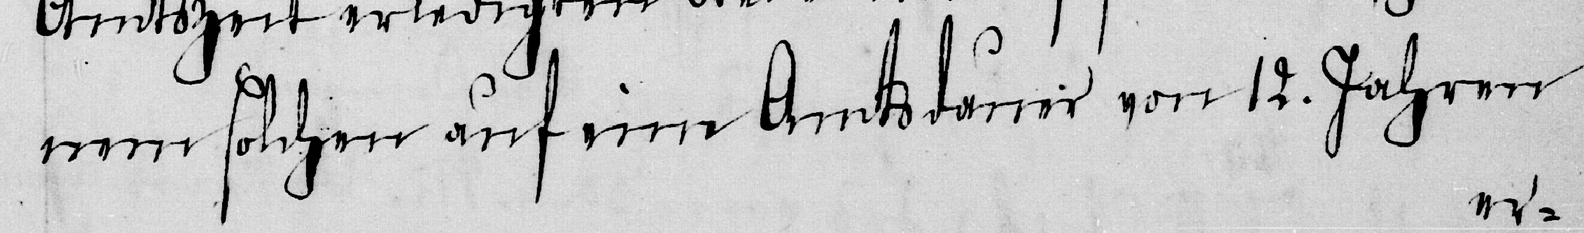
nem solchen auf eine Amtsdauer von 12. Jahren
